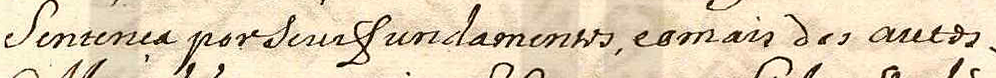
Sentença por seus fundamentos, e o mais dos autos.
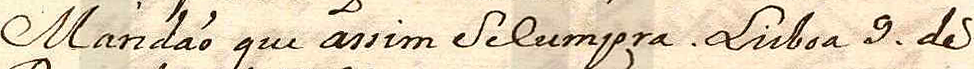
Mandaõ que assim Se Cumpra. Lisboa 9. de
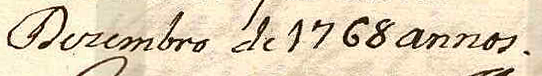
Dezembro de 1768 annos.
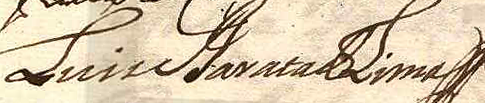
Luis Barata d̄ Lima
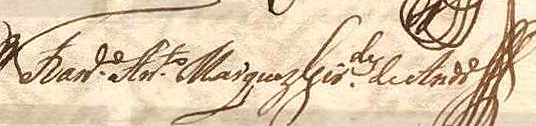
Fran.co Ant.o Marquez Gir.des de Andre
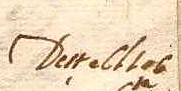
Deste cl 106
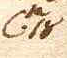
C.ta 18
